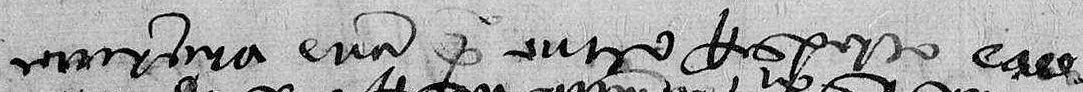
concyēcya e nā p̄o outro Respeyto e all
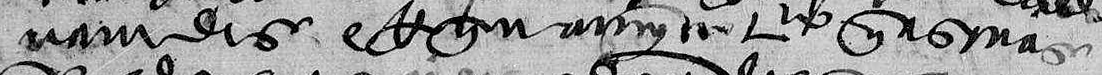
nam dise e Rogou a mȳ notro q̄ asynase
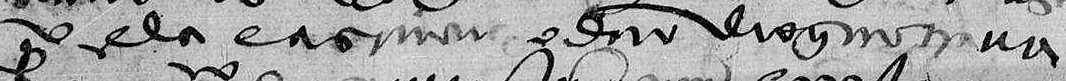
p̄o ela e asjnou o dito dioguo traua
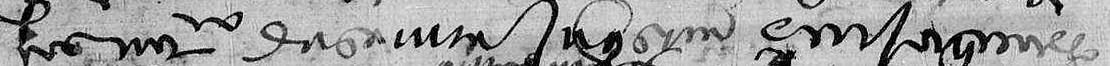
ços notro da samta Jnq̄syçā E eu Jorge coelho
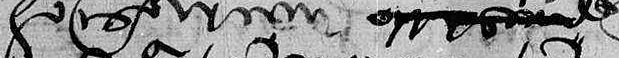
ho esp̄vy com o rryscado
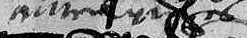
antrelynhas
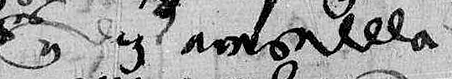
q̄ dizē a casa della
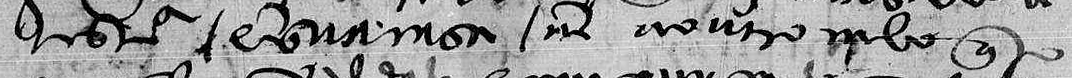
testa / ē sua casa / nē a outro cabo q̄ to
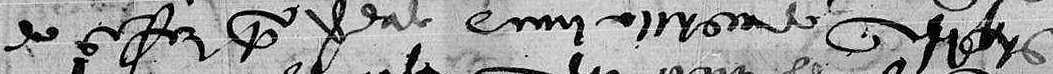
do se fez p̄o ꝟdade e com o rryscado q̄ djz Rys
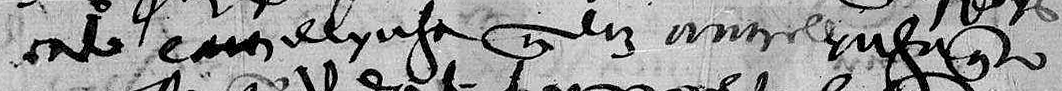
cado e antrellynha q̄ diz antrellynha q̄ to
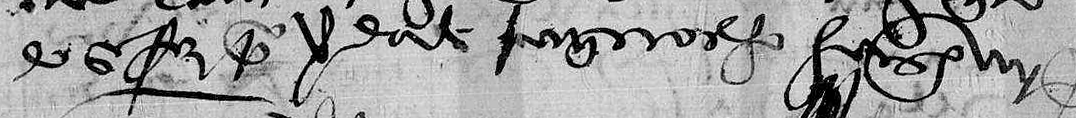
do se fez p̄o ꝟdade Jorge coelho ho esp̄vy
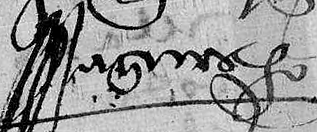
Jorge coelho
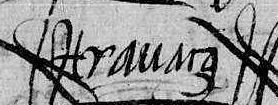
Trauacꝯ
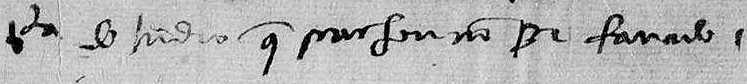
vta do Jndio q̄ se achou nō ꞩr fanado
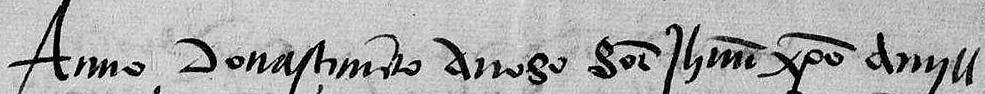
Anno Do nascimēto de noso Sōr Jhuū xp̄o de mjll
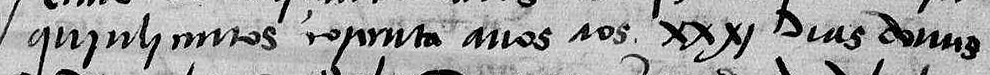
qujnhemtos coremta anos aos xxxj dias do mes
